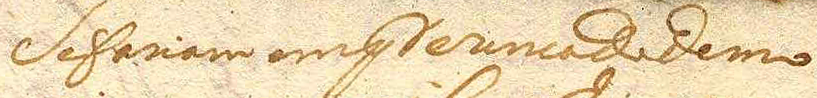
se faziam em prezenca do demo
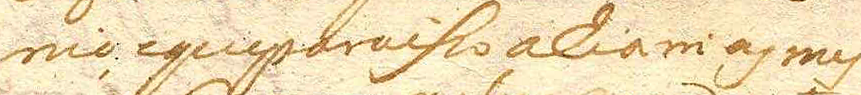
nio, e que para isso a hiam as mes
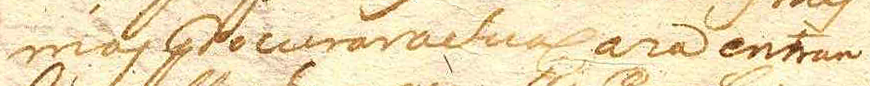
mas procurar a sua Caza entran
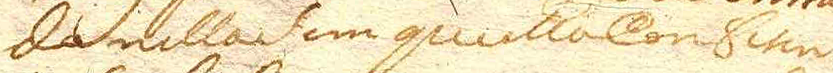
do nella sem que ella Confiten
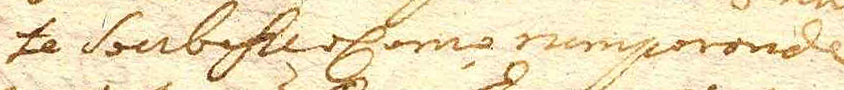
te soubesse o Como, nem por onde
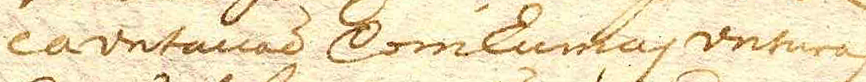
e a vntauaõ com humas vnturas
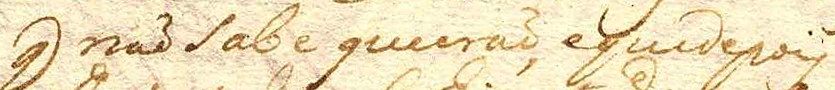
q̄ naõ sabe que eraõ, e que depois
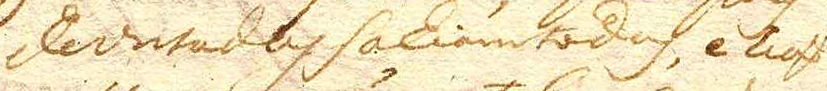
de vntadas sahiam todas, e hiaõ
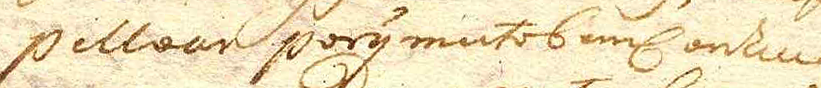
pello ar porq̄ muto bem Conhecia
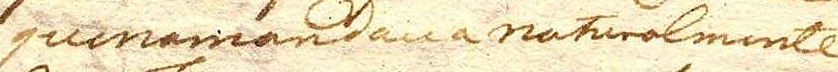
que nam andaua naturalmente
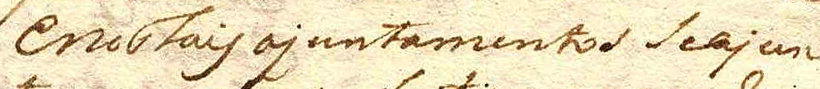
e nos tais ajuntamentos se ajun
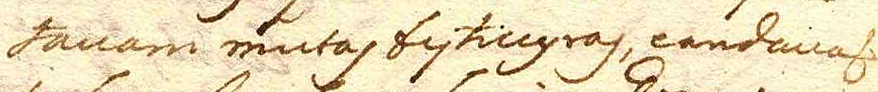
tauam mutas fejticeyras, e andauaõ
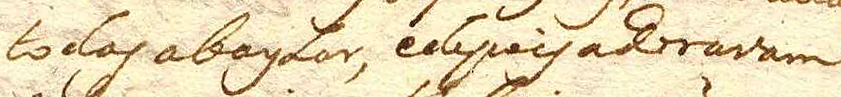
todas a bayLar, e depois adoravam
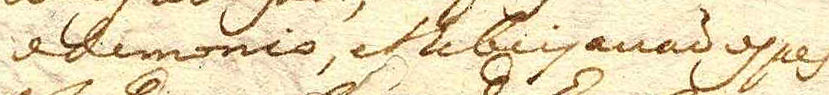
o demonio, e lhe beijauaõ os pes
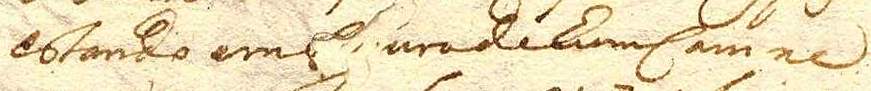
estando em _ura de hum Cam ne
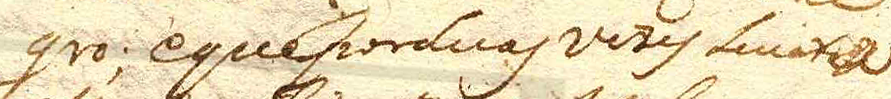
gro; e que por duas vezes Leuara
